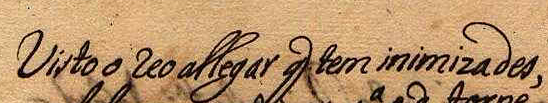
Visto o Reo allegar q̄ tem inimizades,
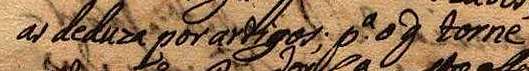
as deduza por artigos; p.a o q̄ torne
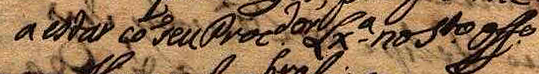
a estar cō seu Proc.dor Lx.a no S.to off.o
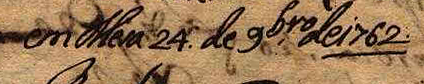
em Mesa 24. de 9.bro de i762.
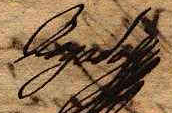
Rogado
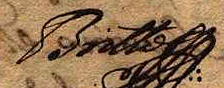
Britto
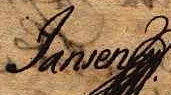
Iansen
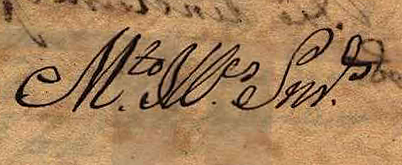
M.to Ill.es Snr.es
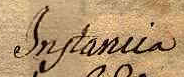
Instancia
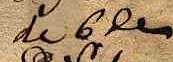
de 6 de
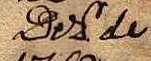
Dezr de
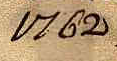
1762
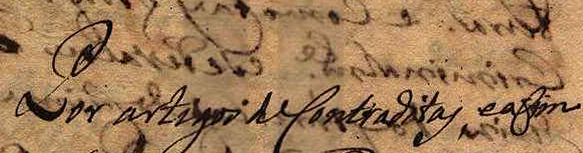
Por artigos de Contraditas, e afim
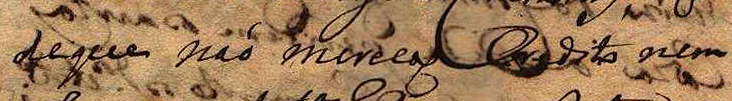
de que naõ mereçaꝭ Credito nem
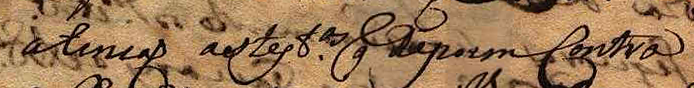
atençaꝭ as test.as q̄ depoem Contra
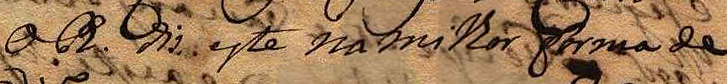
o R. dis este na milhor forma de
